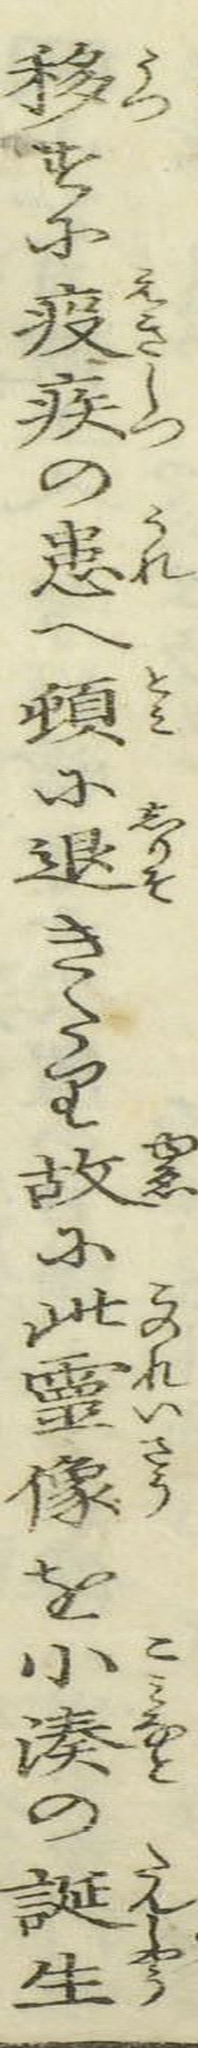移すに疫疾の患へ頓に退きたり故に此霊像を小湊の誕生
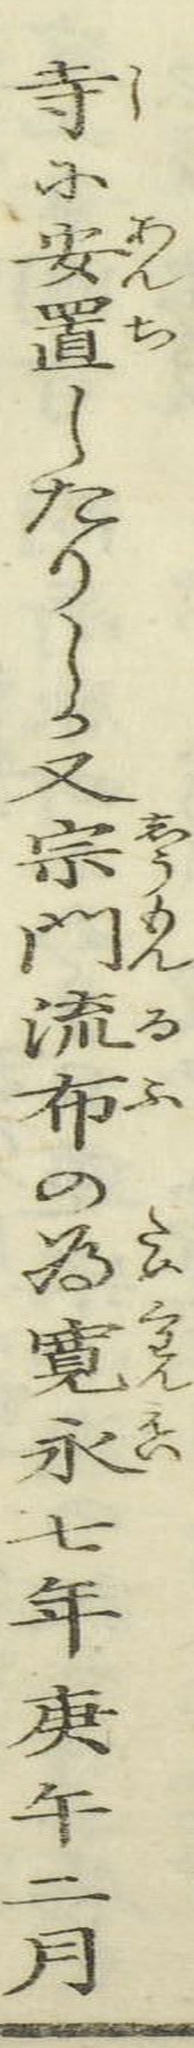寺に安置したりしか又宗門流布の為寛永七年庚午二月
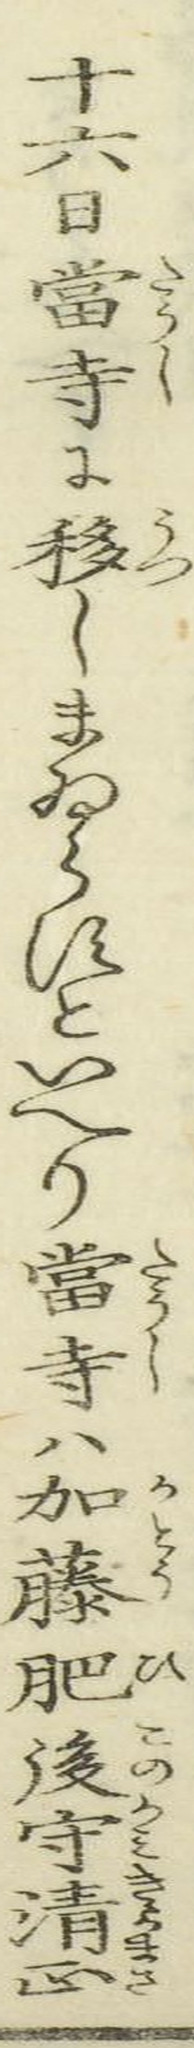十六日当寺に移しまゐらすといへり当寺は加藤肥後守清正
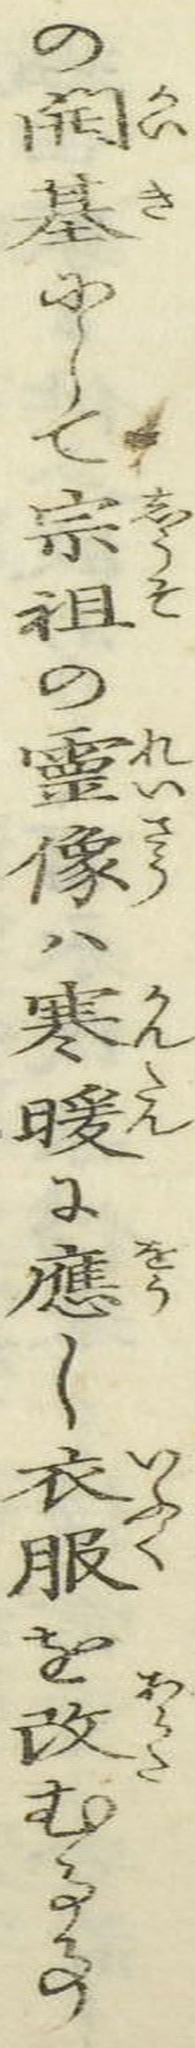の開基にして宗祖の霊像は寒暖に応し衣服を改むる事
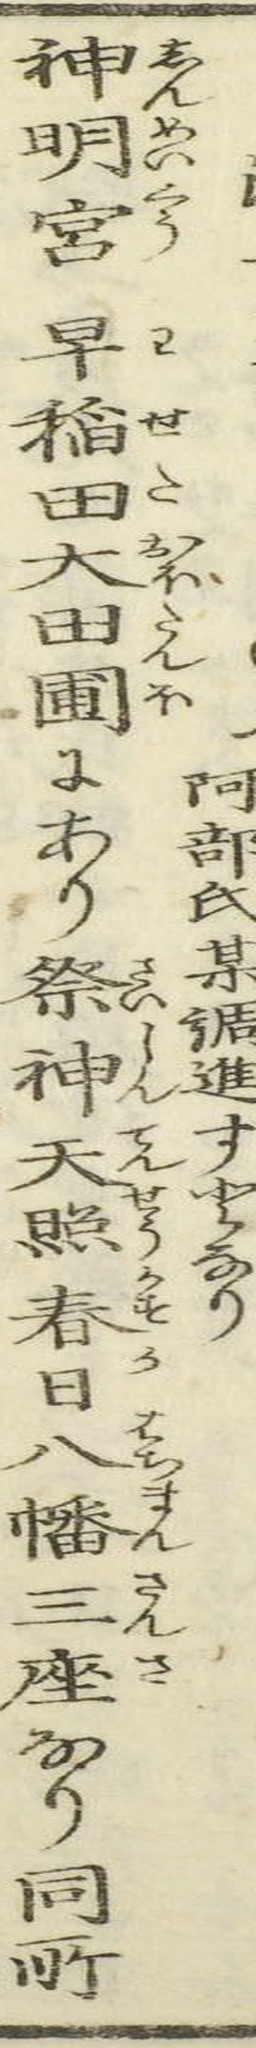神明宮早稲田大田圃にあり祭神天照春日八幡三座なり同所
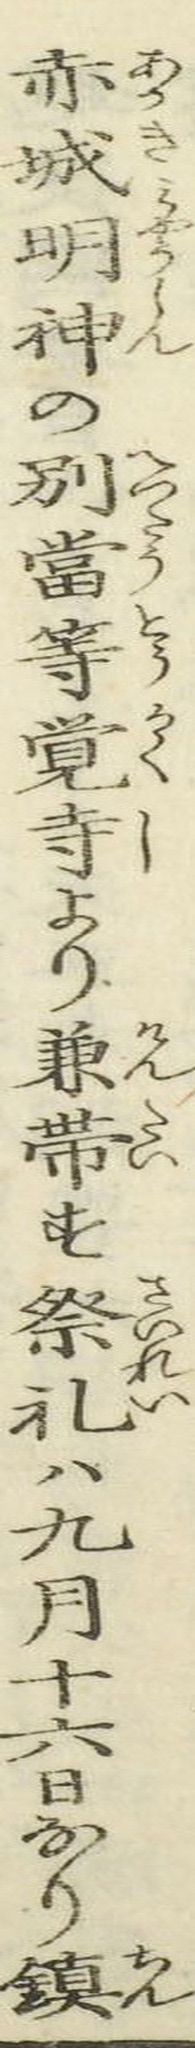赤城明神の別当等覚寺より兼帯す祭礼は九月十六日なり鎮
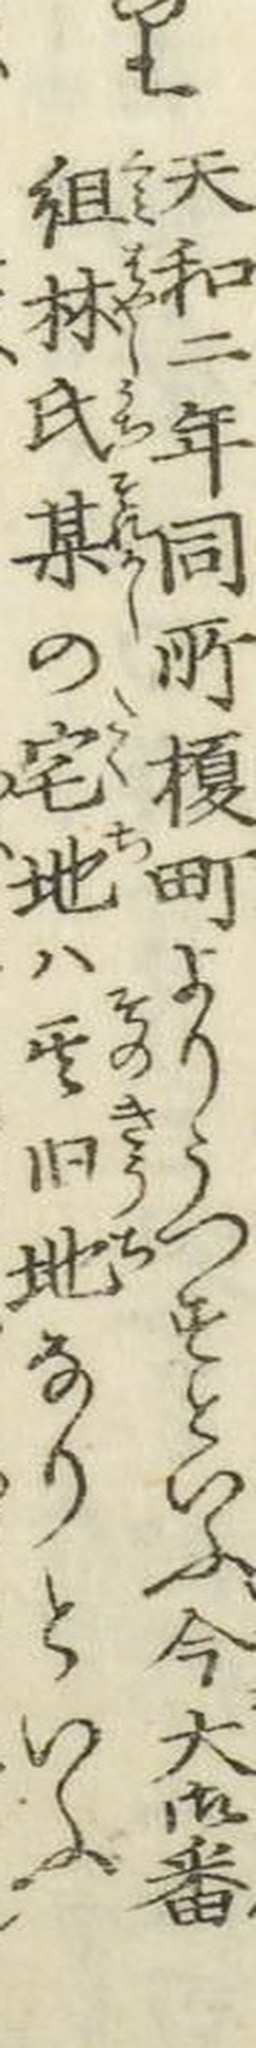組林氏某の宅地は其旧地なりといふ
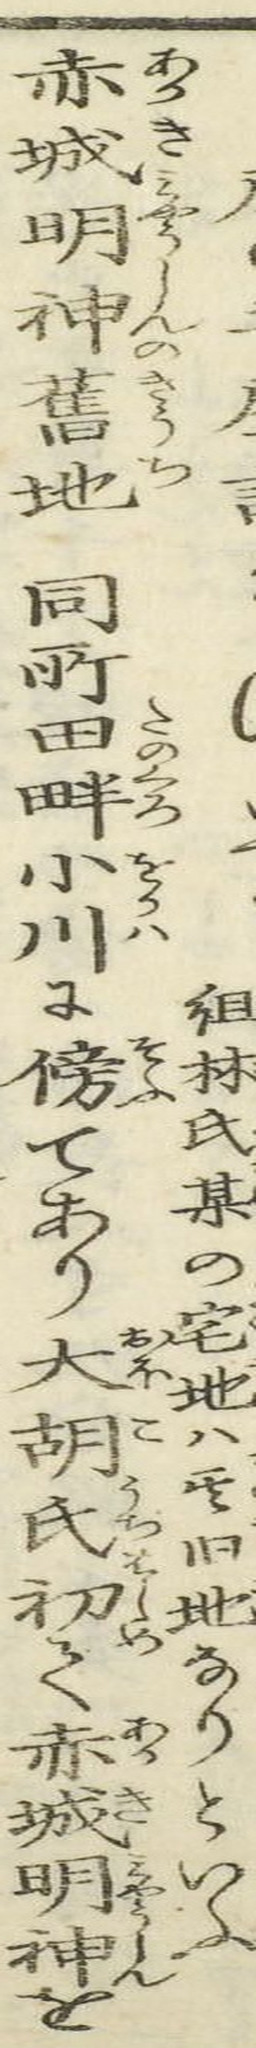赤城明神旧地同所田畔小川に傍てあり大胡氏初て赤城明神を
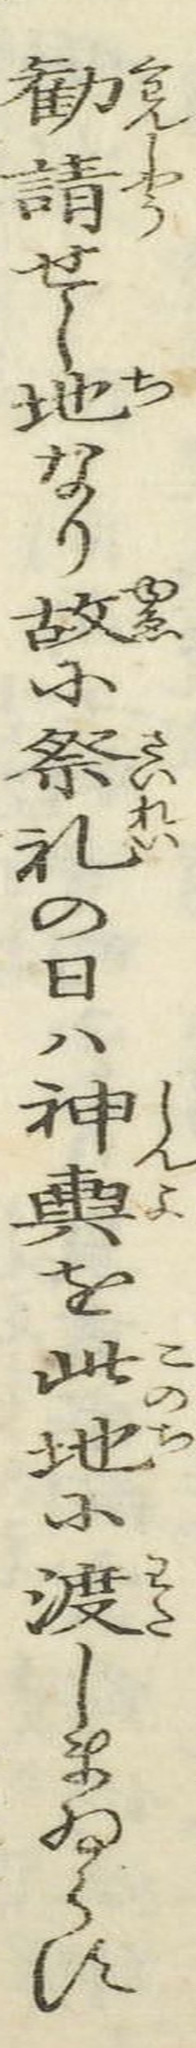勧請せし地なり故に祭礼の日は神輿を此地に渡しまゐらす
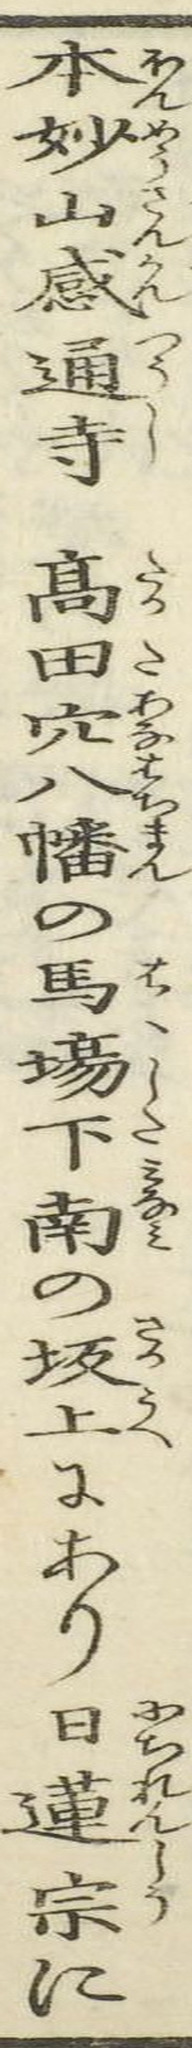本妙山感通寺高田穴八幡の馬場下南の坂上にあり日蓮宗に
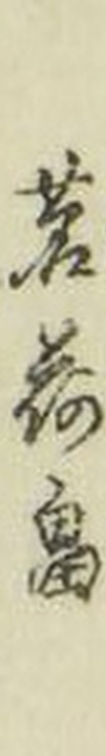茗荷畠

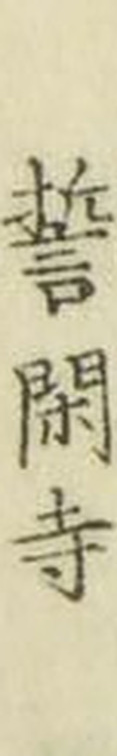誓閑寺
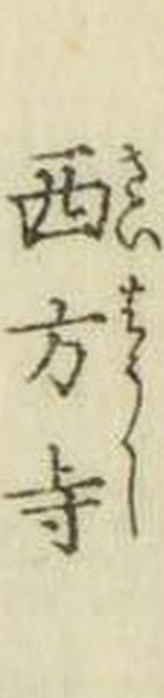西方寺
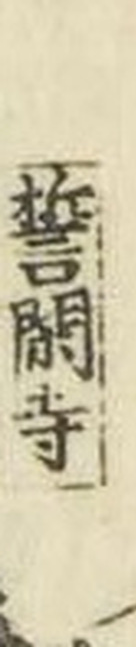誓閑寺
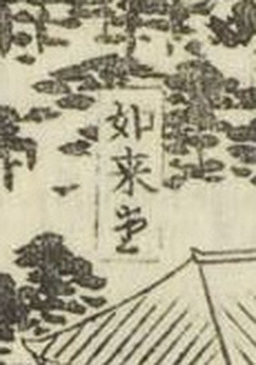如來堂
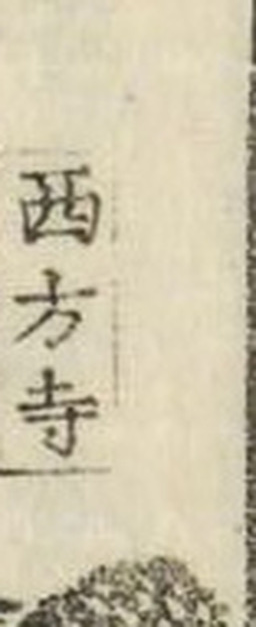西方寺
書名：江戸名所図会 20巻 巻之11
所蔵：東京学芸大学教育コンテンツアーカイブ
